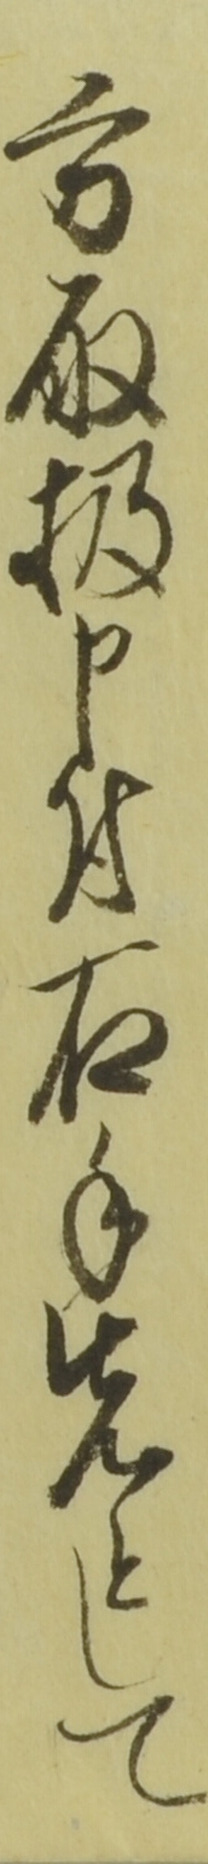方取扱申付右手先として
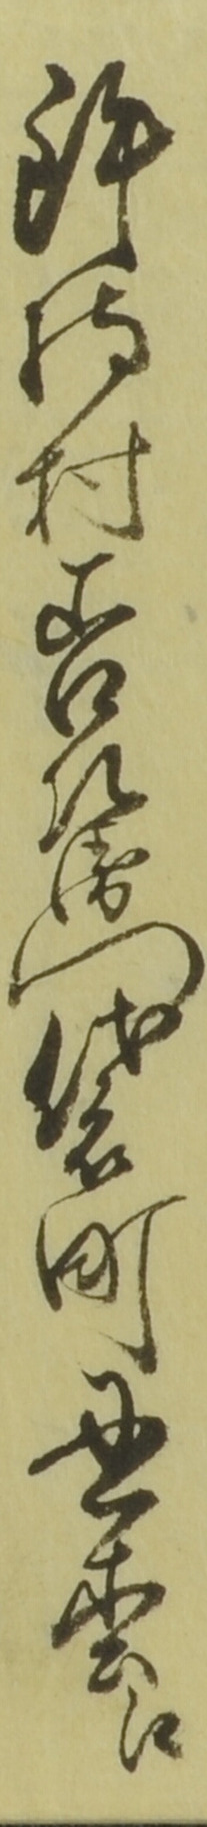鉾持村善左衛門袋町丑松江
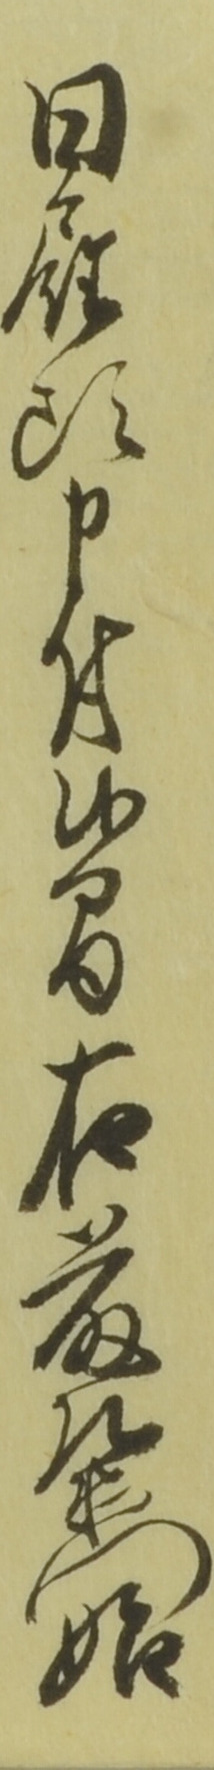日雇頭申付候間右藤左衛門始
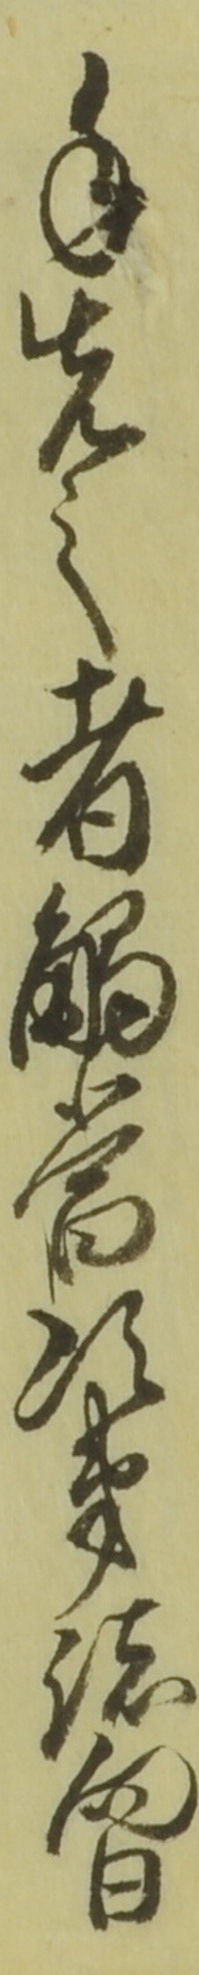手先之者触当次第諸向日
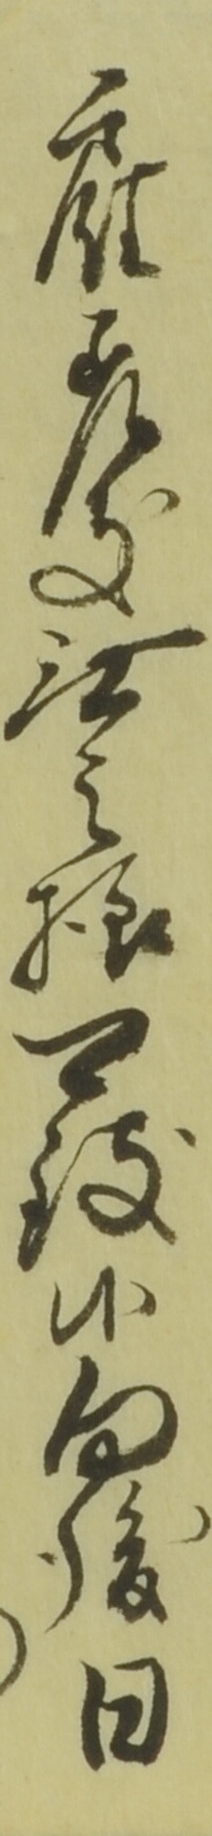雇差支無之様可致候向後日
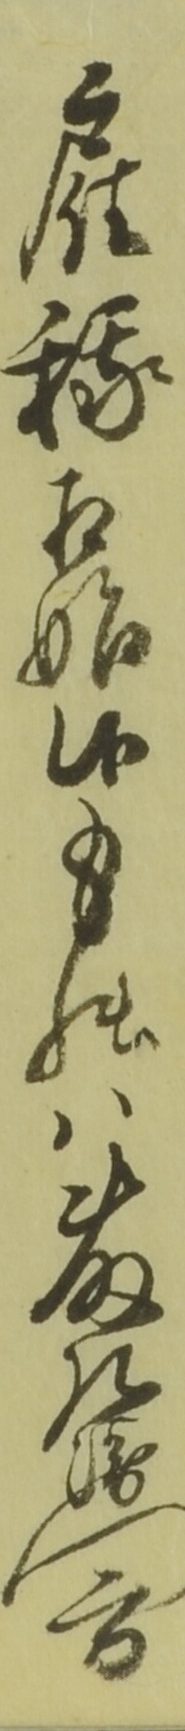雇稼相始候ものハ藤左衛門方
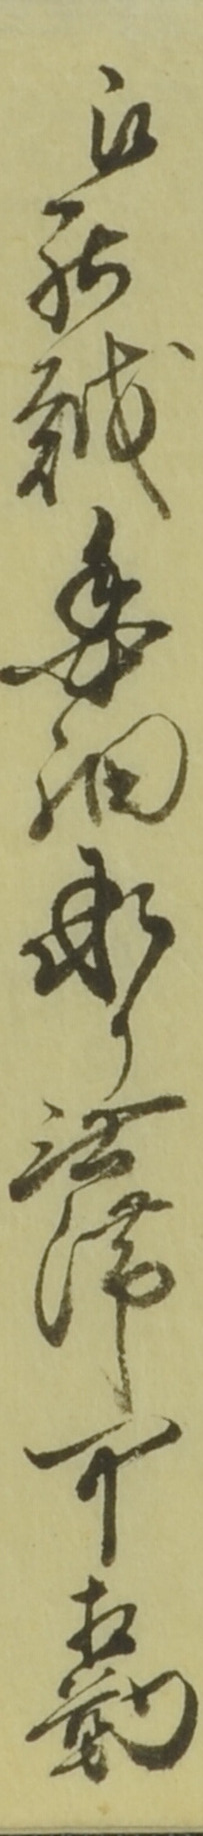江罷越委細承り無滞可相勤
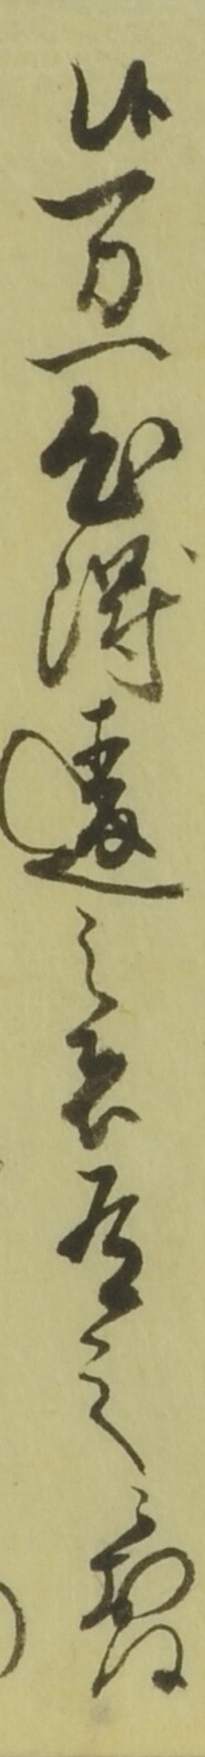候万一心得違之者有之ニおゐ
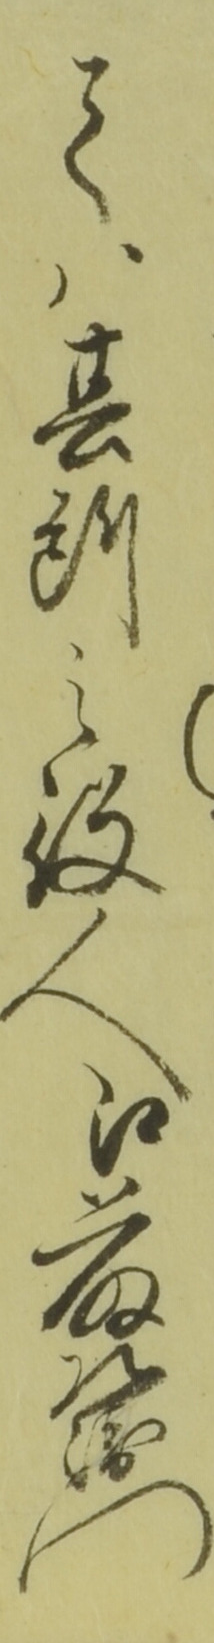てハ其所之役人江藤右衛門
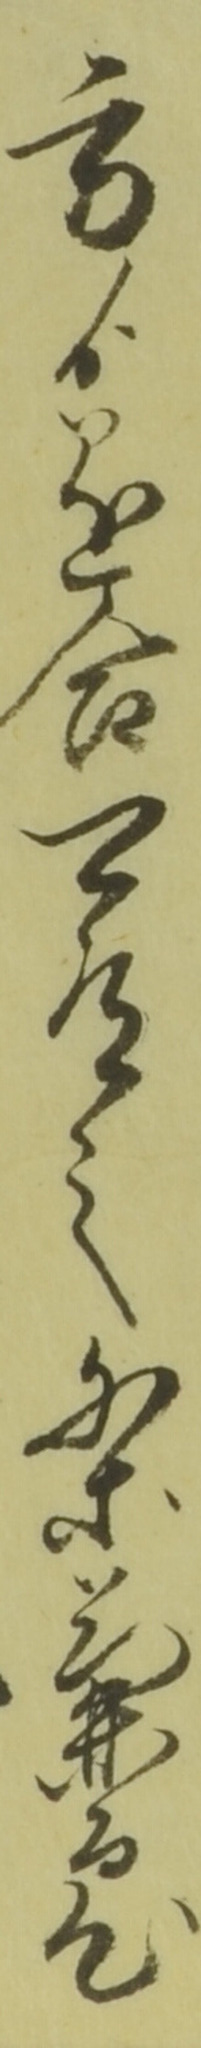方ゟ懸合可有之条兼而心
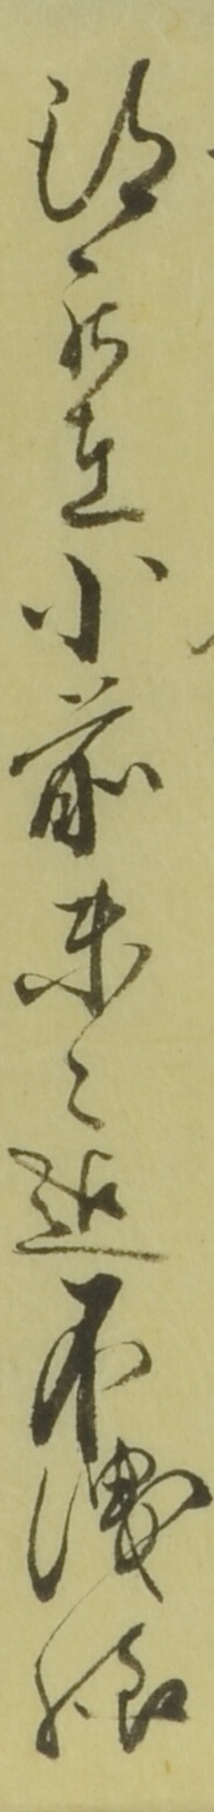得罷在小前末々迄不洩様
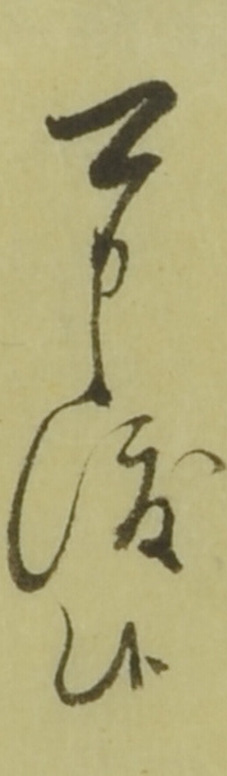可申渡候

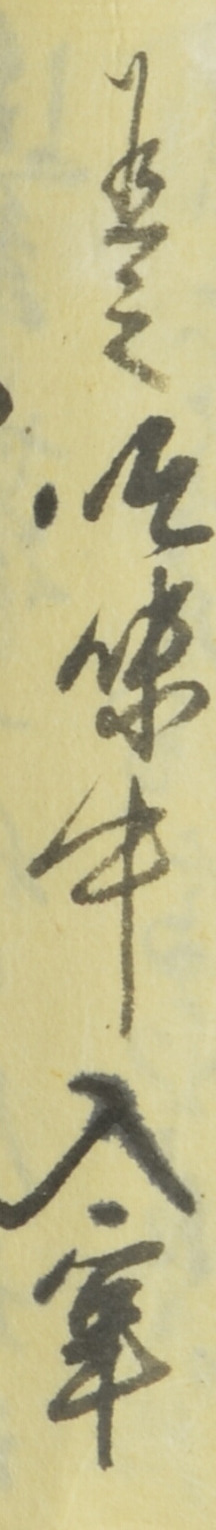有之吟味中入窂
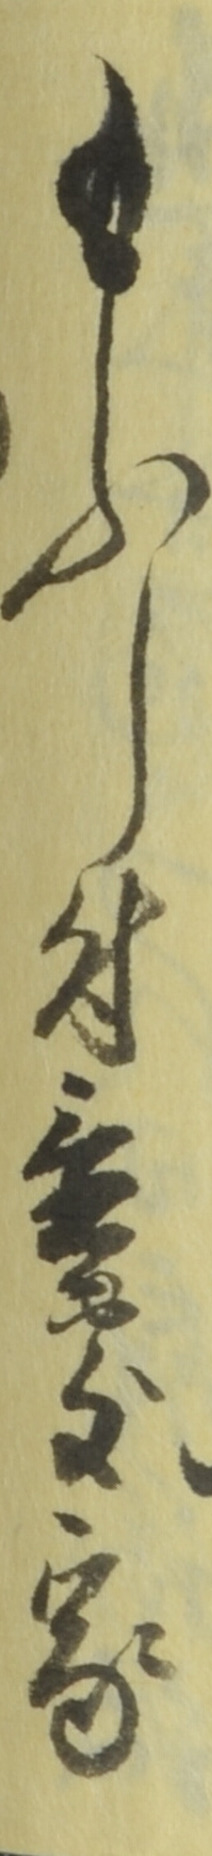もふし付置処家
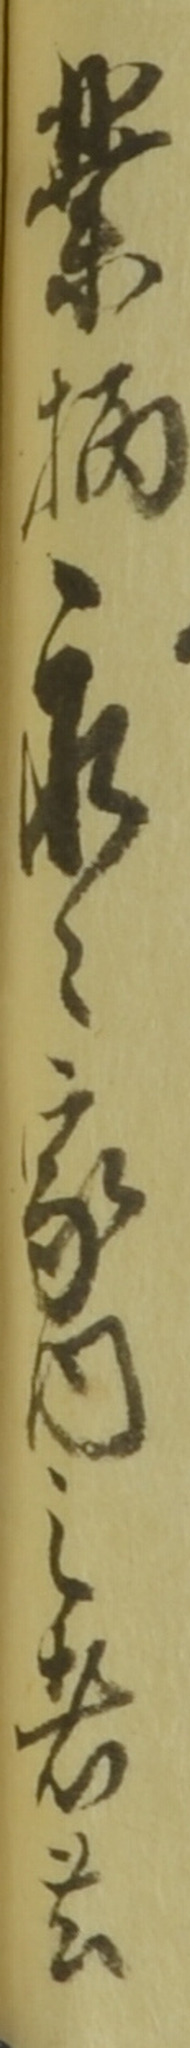業柄永々家内之者共
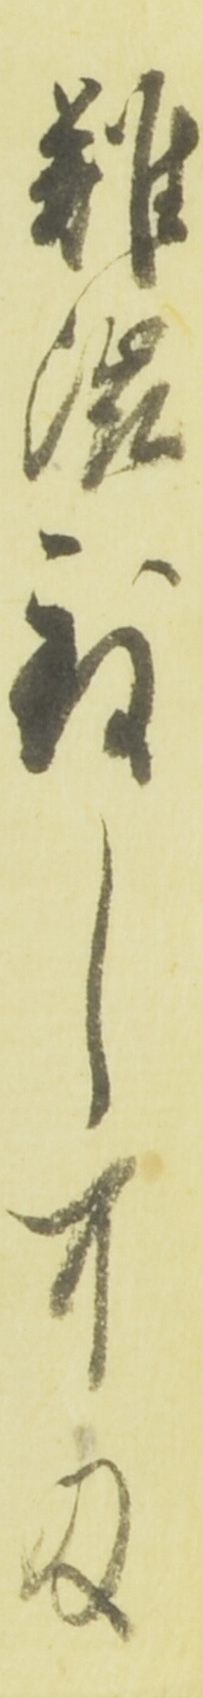難渋致し可及
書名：御触書御書附控
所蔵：伊那市立高遠町図書館・合同会社AMANE
